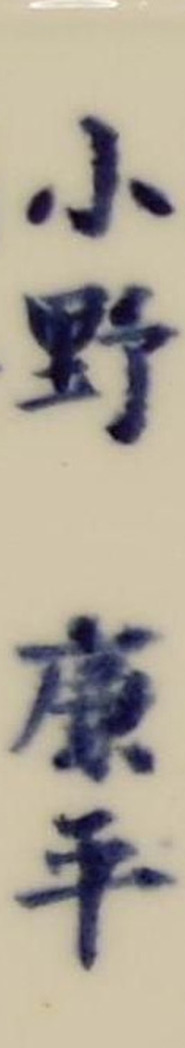小野廉平
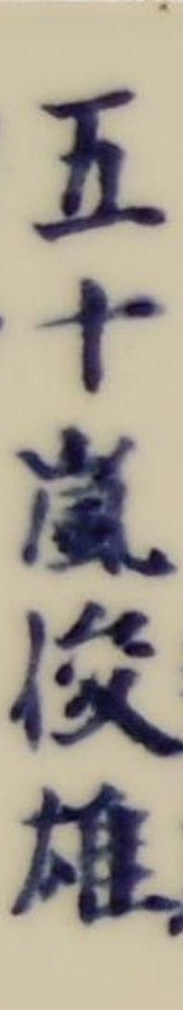五十嵐俊雄
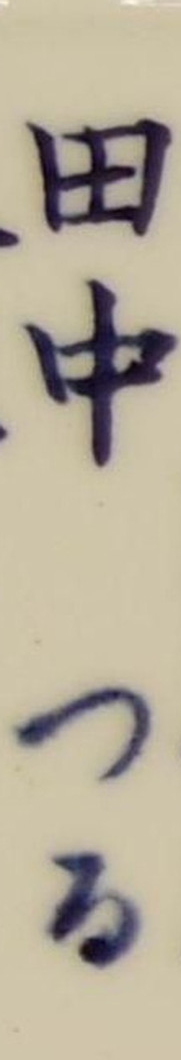田中つる
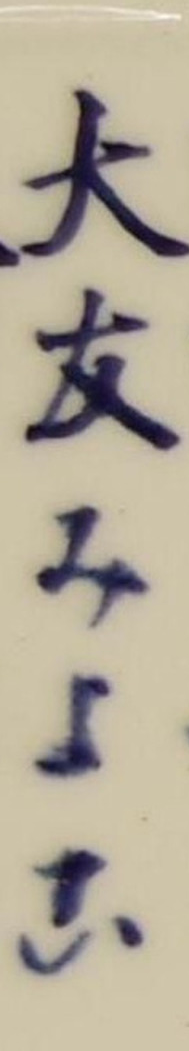大友みよこ
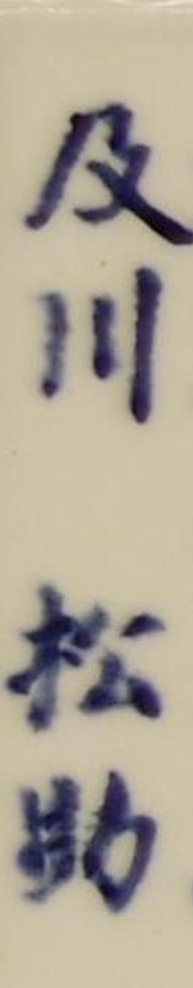及川松助

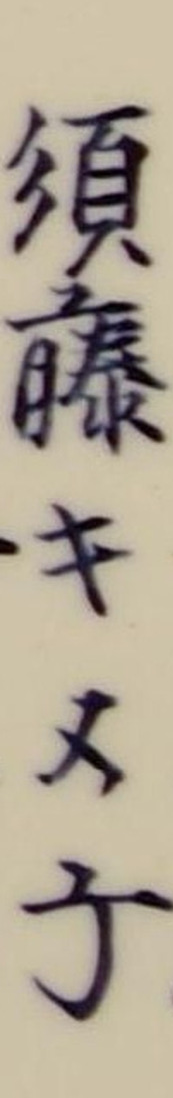須藤キヌ子
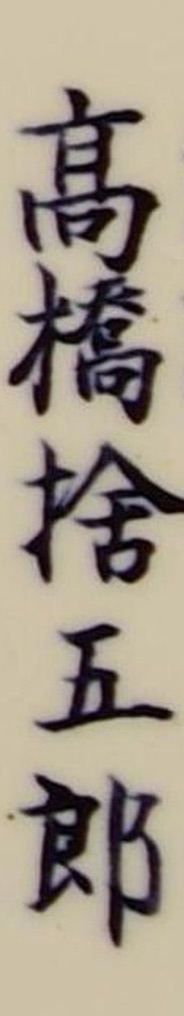高橋捨五郎
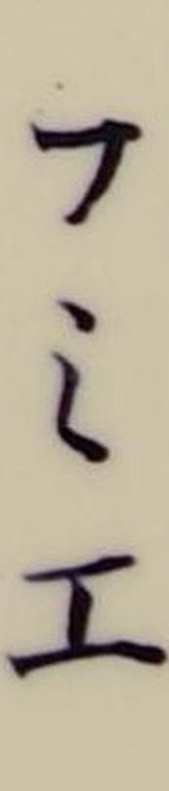フミ工
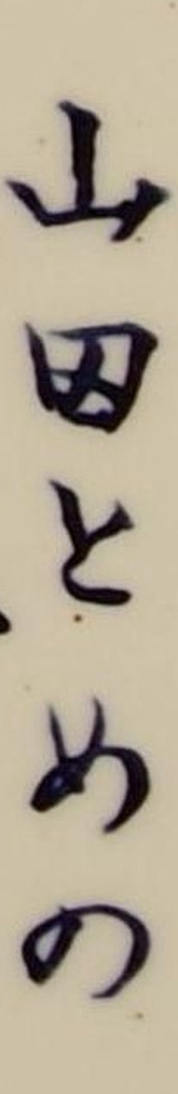山田とめの
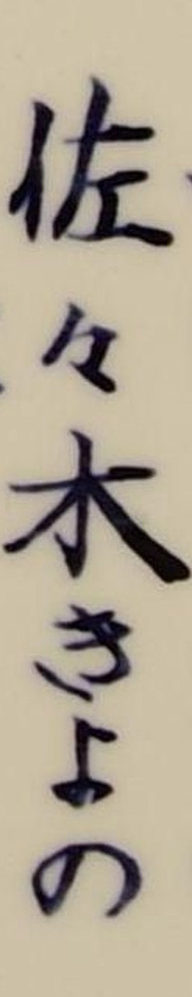佐々木きよの
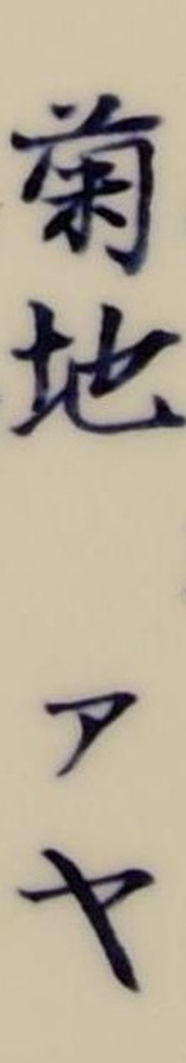菊地アヤ
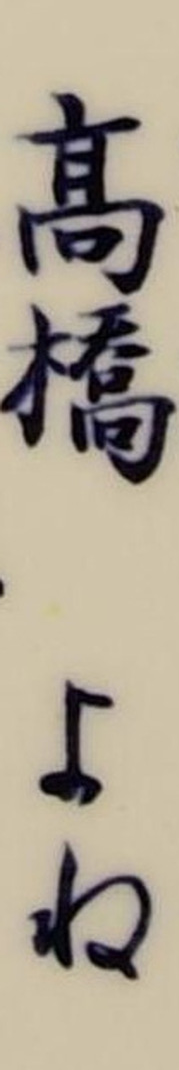高橋よね
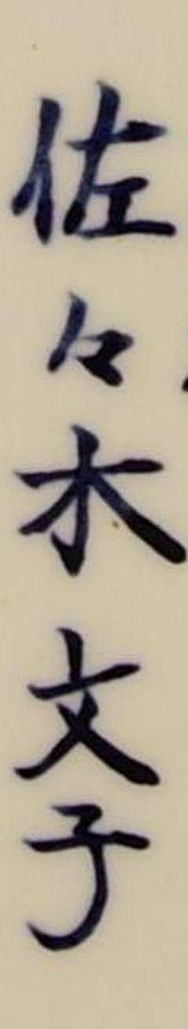佐々木文子
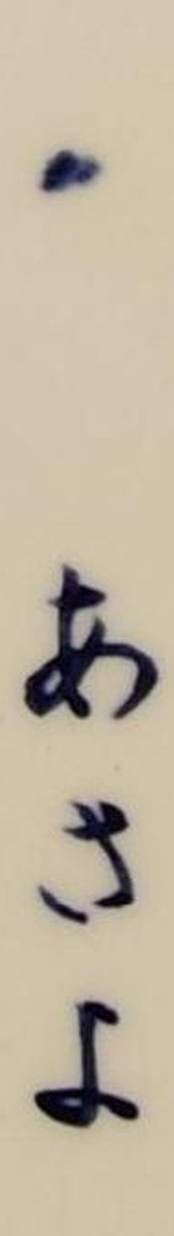あさよ
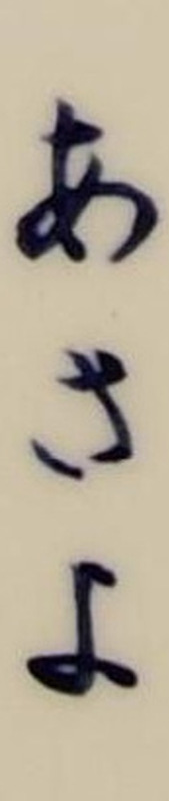あさよ
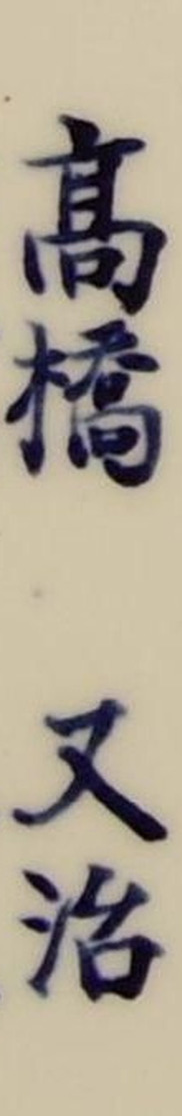高橋又治
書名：A~D
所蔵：koyasan kongobuji
